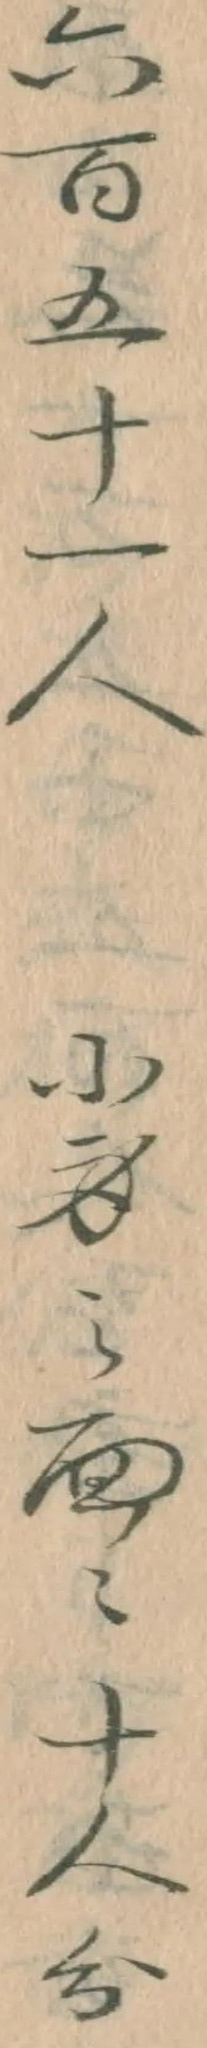六百五十一人小身之面々十人分
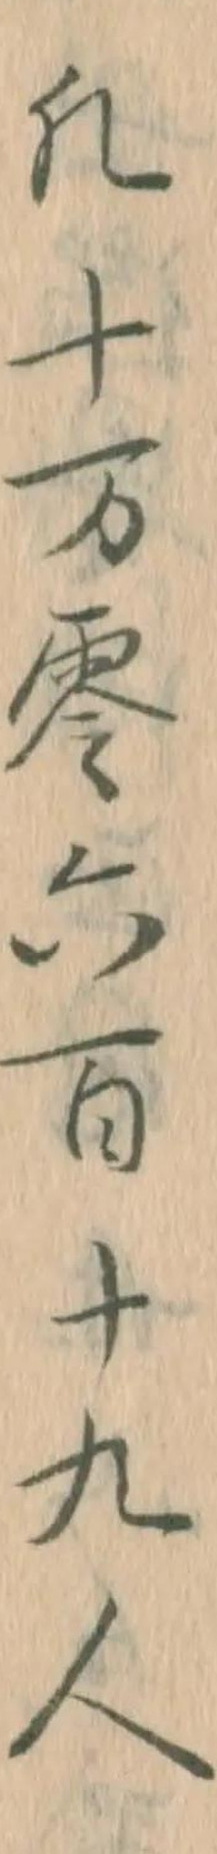凡十万零六百十九人
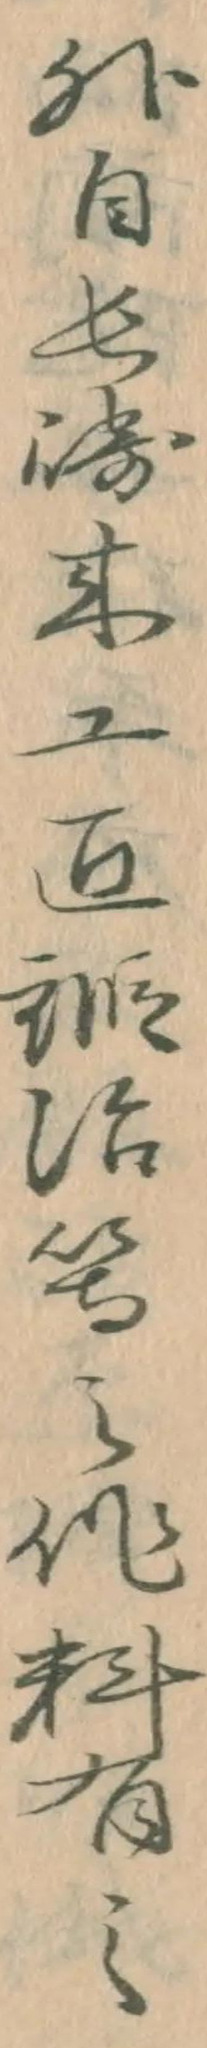外自長崎来工匠鍛冶等之作料有之

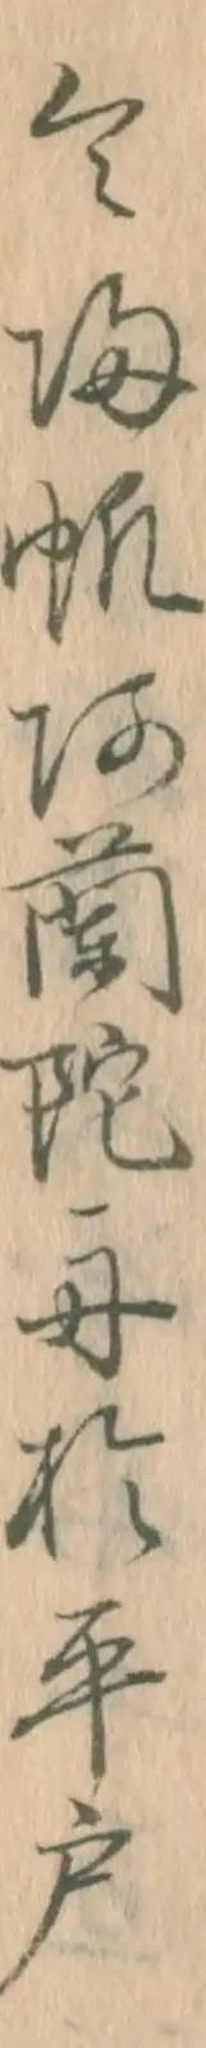令海帆阿蘭陀舟於平戸
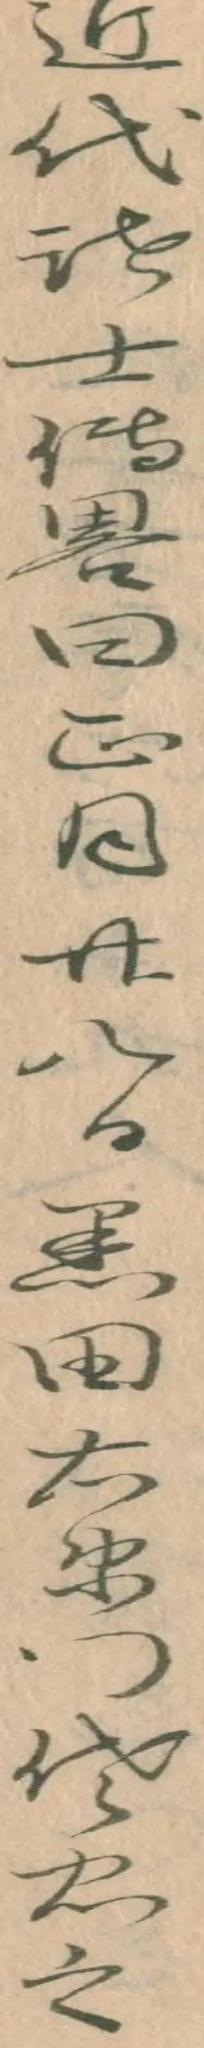近代諸士伝略曰正月廿八日黒田右衛門佐忠之
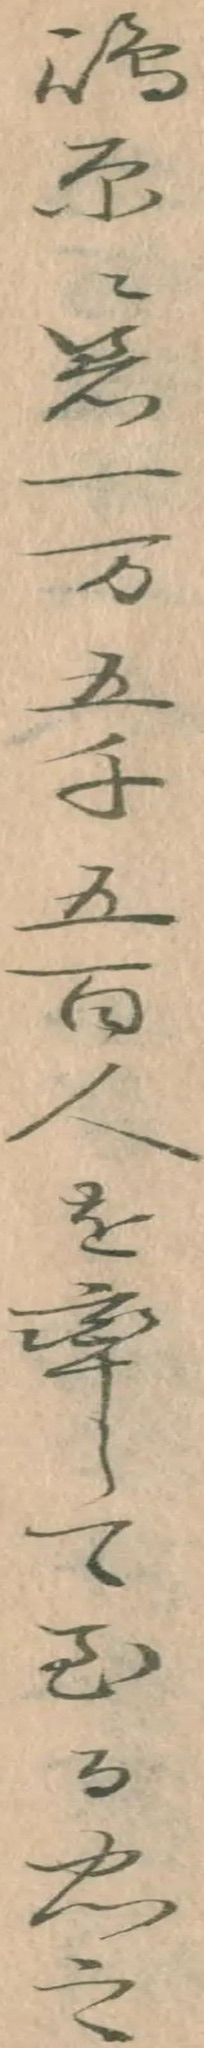島原に着一万五千五百人を率して至る忠之
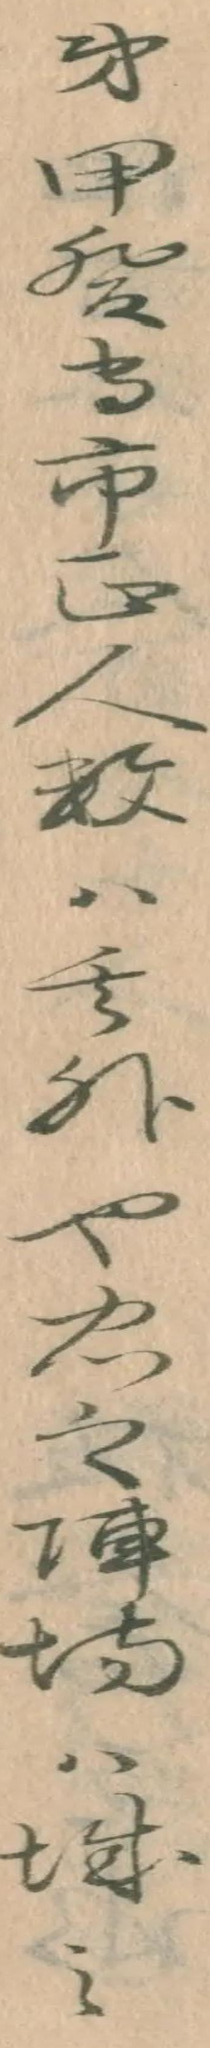弟甲斐守市正人数は其外や忠之陣場は城之
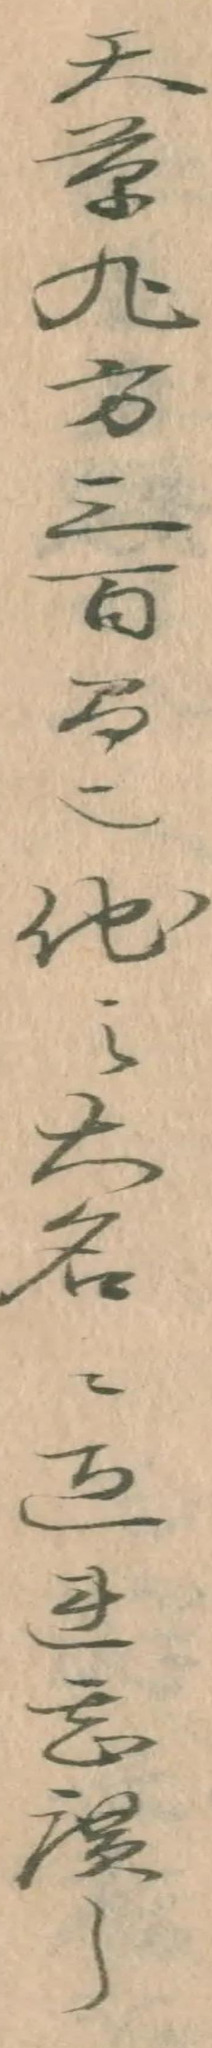天草丸方三百間也他之大名に過連甚広し
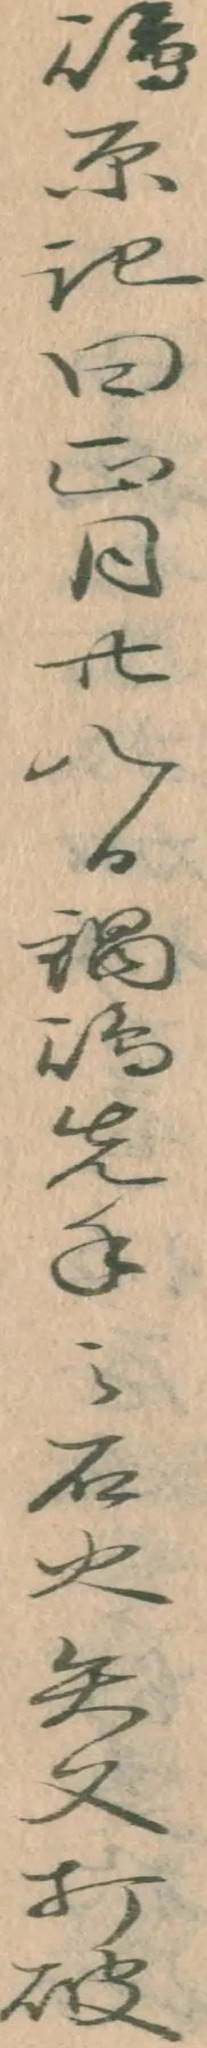島原記曰正月廿八日鍋島先手之石火矢文打破
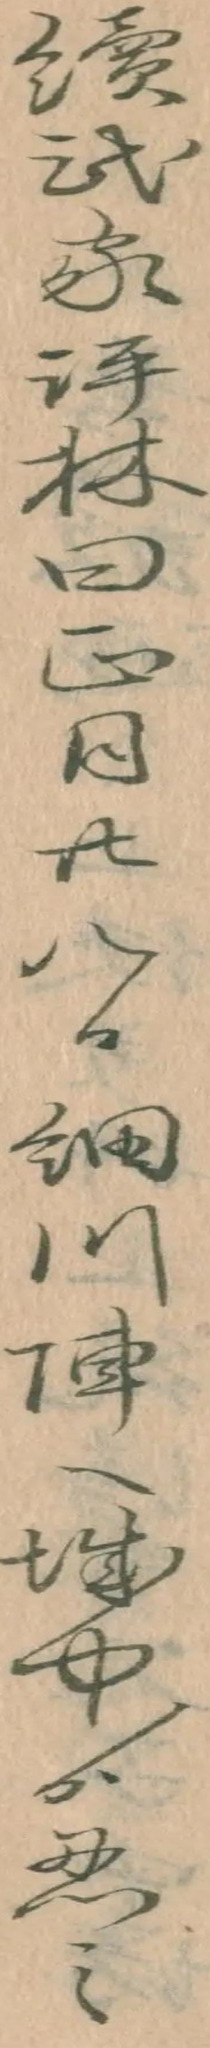続武家評林曰正月廿八日細川陣へ城中ゟ忍之
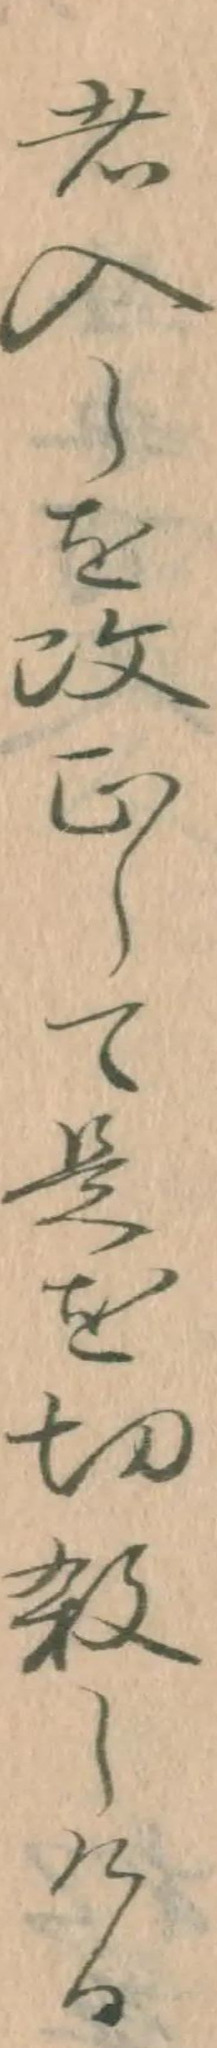者入しを改正して是を切殺しける
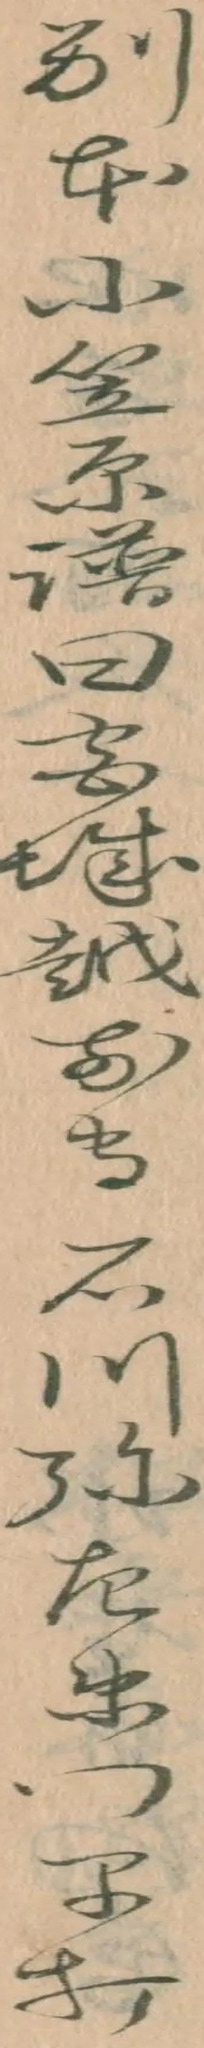別本小笠原譜曰宮城越前守石川弥左衛門早打
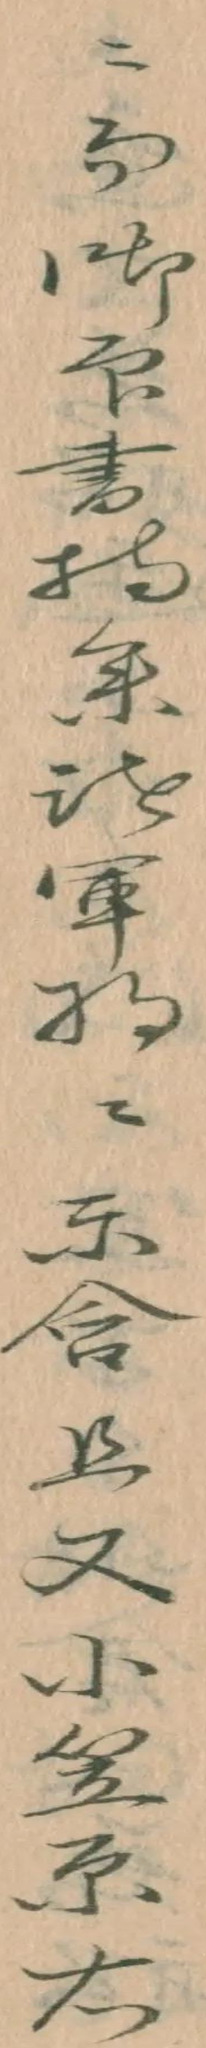に而御印書持参諸軍将に示合且又小笠原右
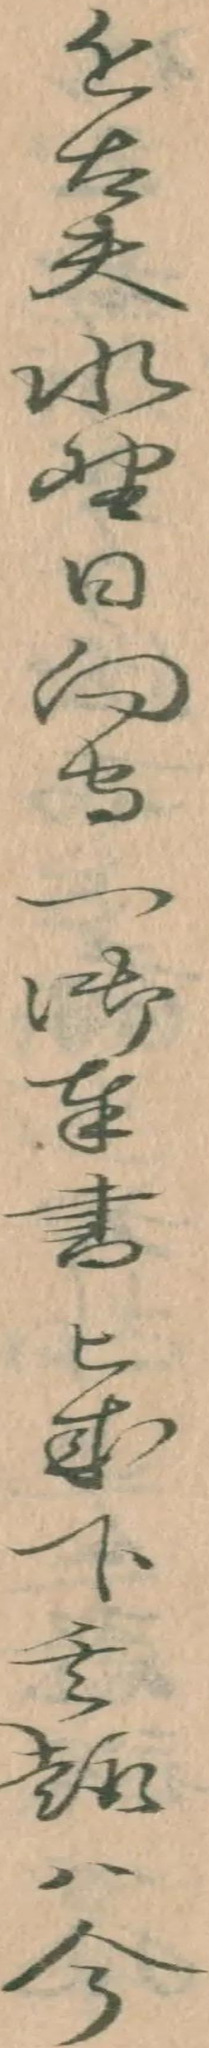近太夫水野日向守一御奉書被成下其趣は今
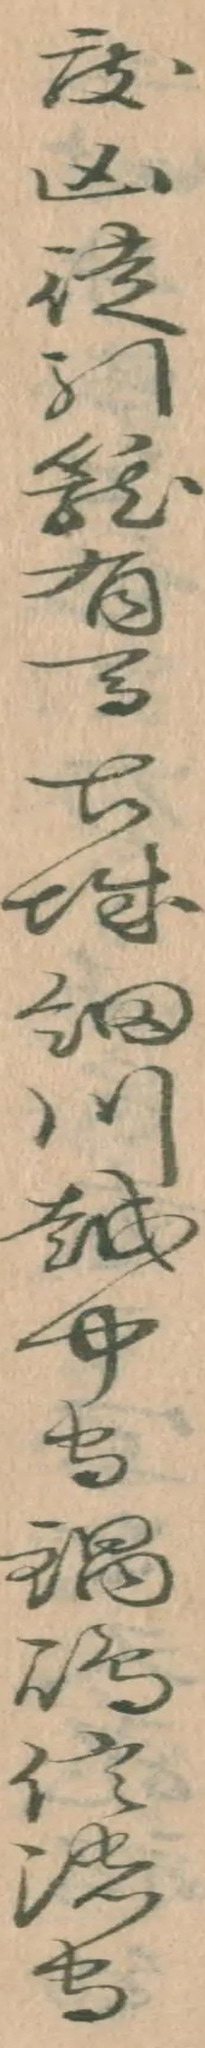度凶徒引籠有馬古城細川越中守鍋島信濃守
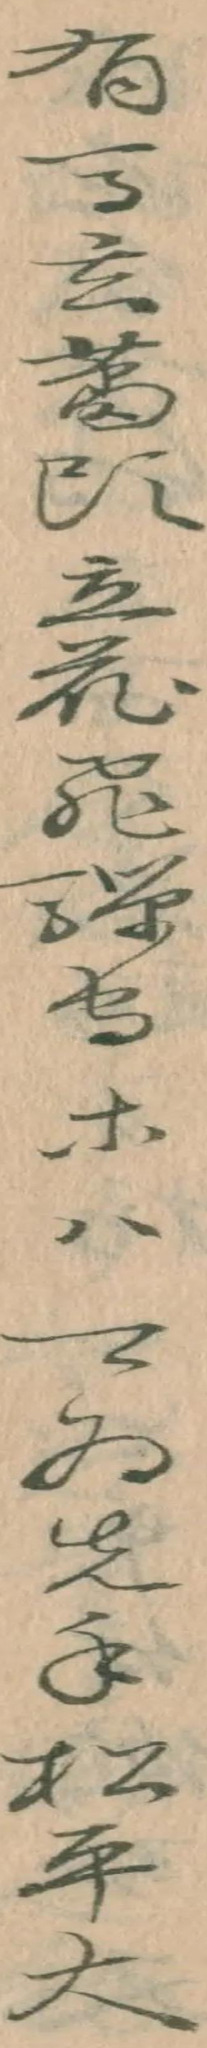有馬玄蕃頭立花飛騨守等は可ゐ先手松平大
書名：切支丹御退治記 49巻. [6]
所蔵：国立国会図書館 National Diet Library, JAPAN
